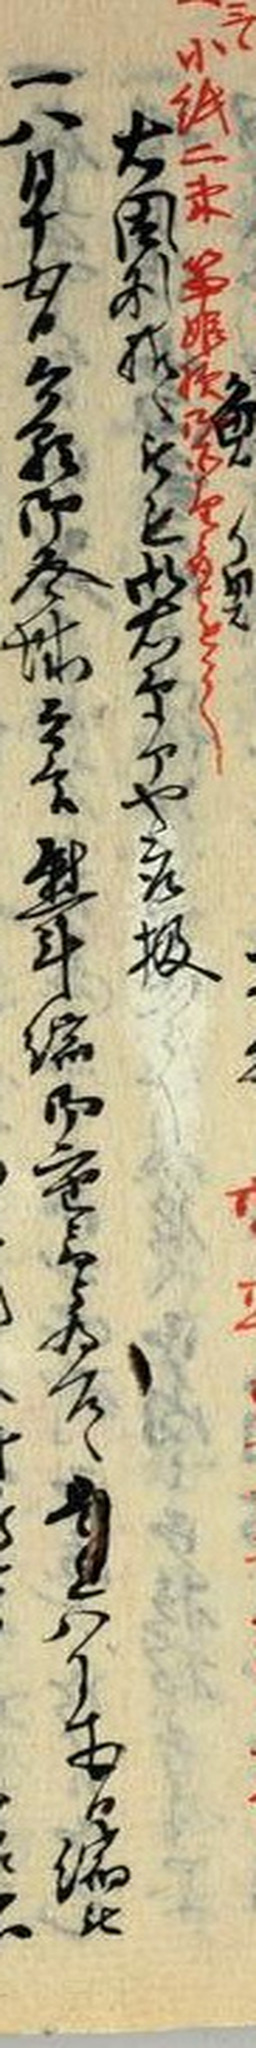一八月十五日今朝御登城之節熨斗縮御重ニ而被為召候是迄八月十五日ゟ縮被
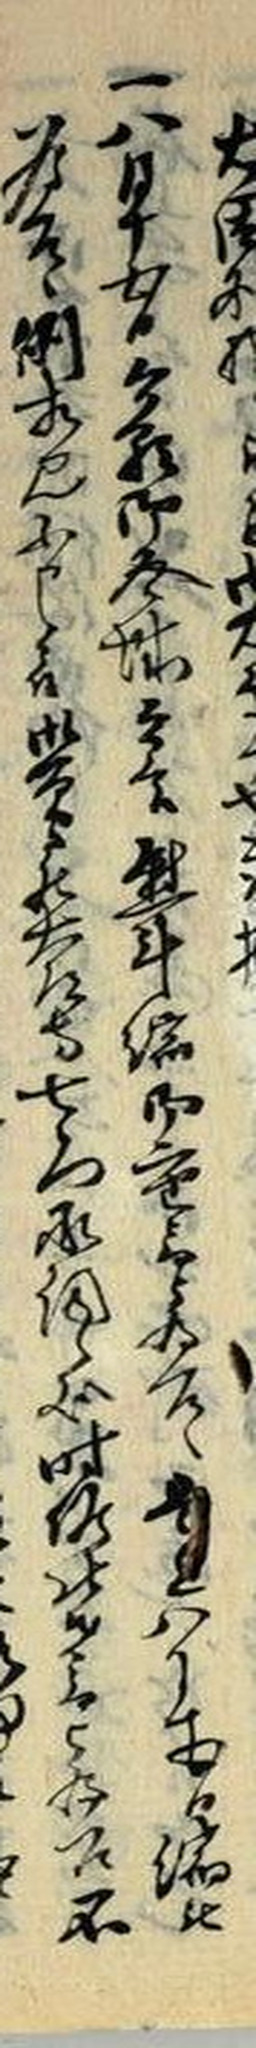為召候例相見不申候ニ付御留守居大道寺七右衛門承調候処時候次第ニ而被為召不
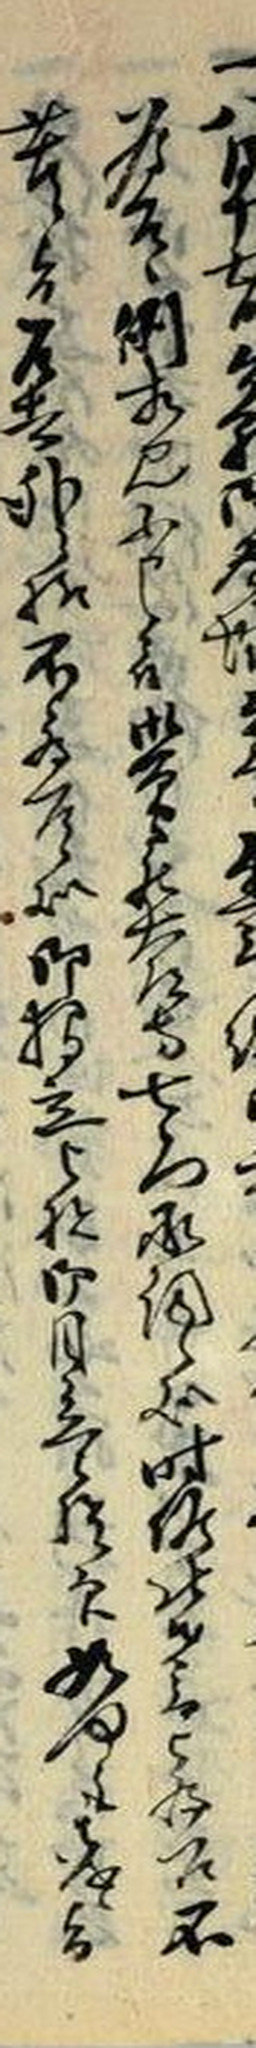苦候旨乍去外々様不被為召候処御狩立被遊御目立被遊候而ハ如何奉存候旨
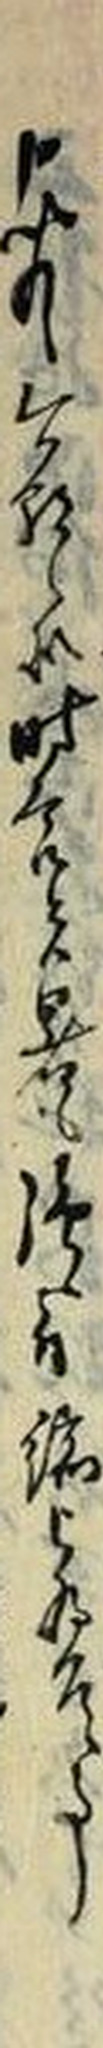申聞今朝之処時節とハ暑も強候ニ付縮被為召候事
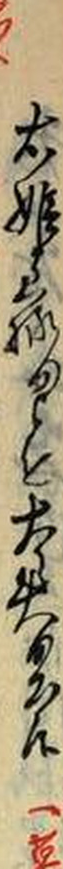右姫君様ゟ被進大奥ゟ出候
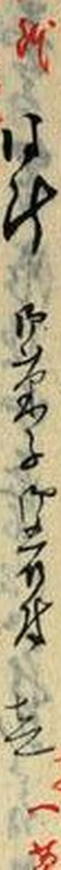同断御菓子御肴付壱
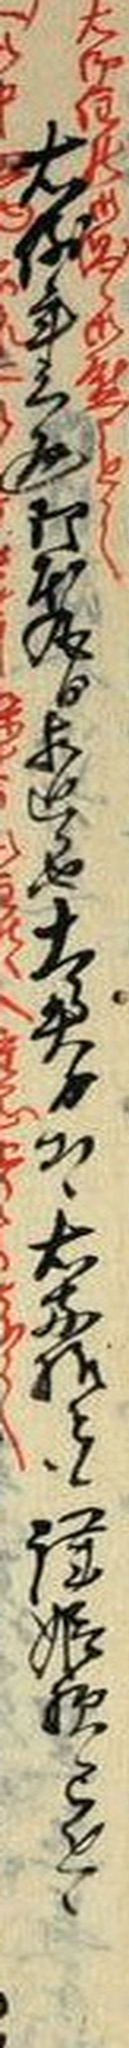右例年之通御本丸ゟ相廻候由大奥ゟ出候右両様とも謹姫様へ被進候
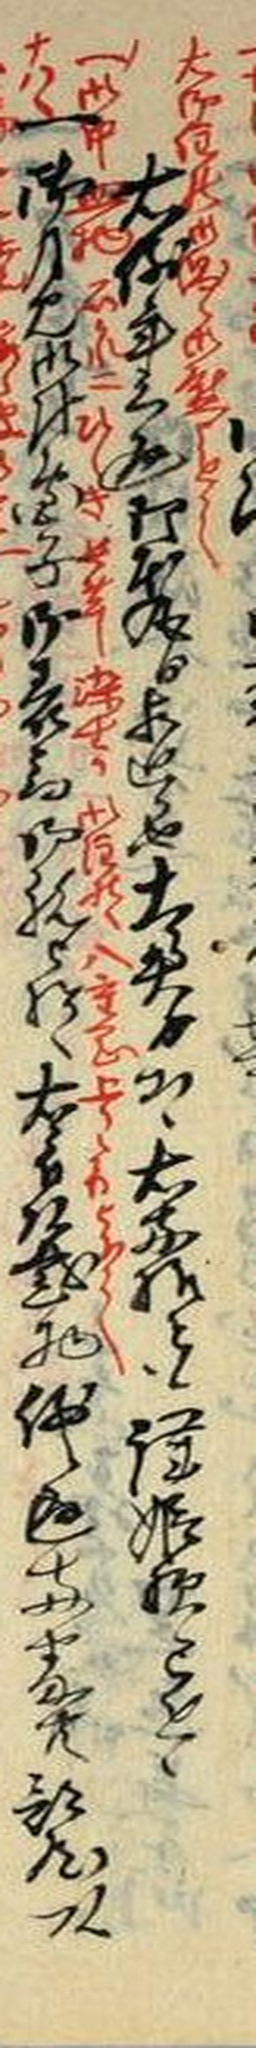一御月見御付団子御表ニ而御祝被遊候右ニ付頂戴物例之通両番共部屋頂
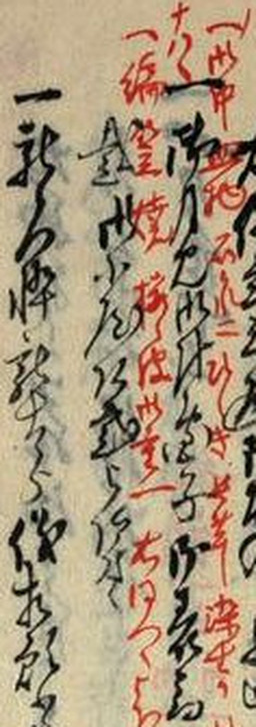戴御小屋頂戴被仰付候
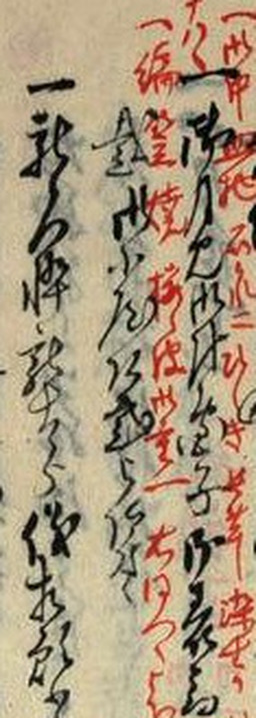戴御小屋頂戴被仰付候
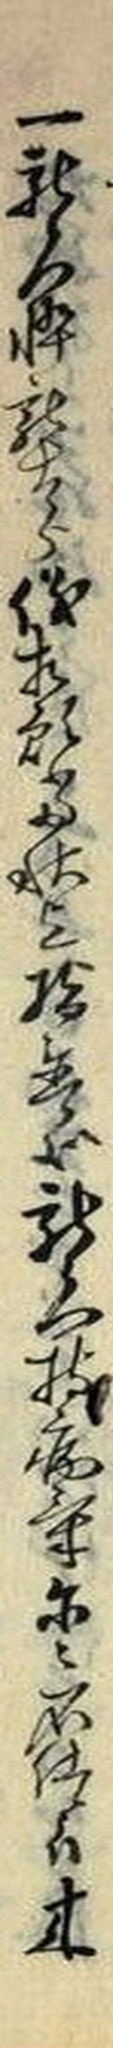一新右衛門忰新太郎儀相願当秋迄指置候処新右衛門持病気爾々不仕候ニ付来
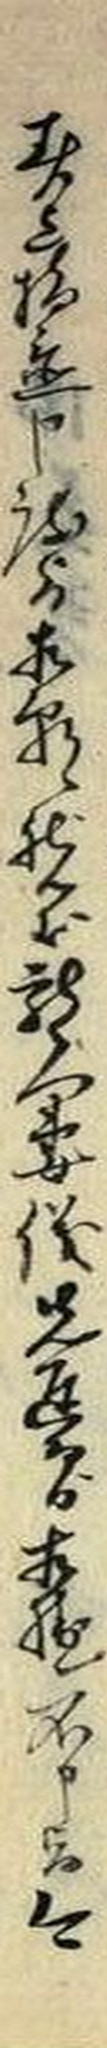春迄指置申度旨相願候然ㇽ処新右衛門妻儀先達而ゟ相勝レ不申旨今
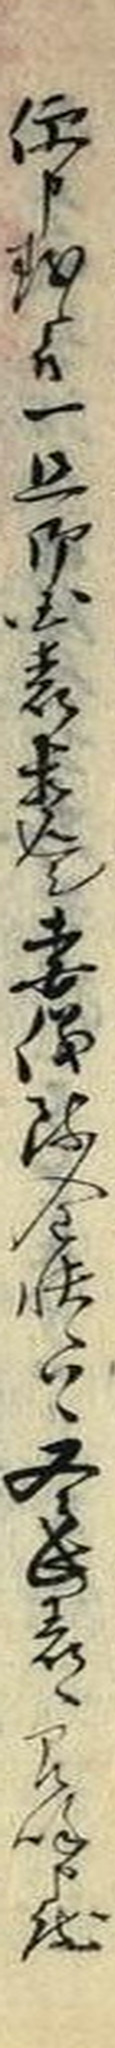便申越候ニ付一旦御国表へ相返シ妻儀致全快候ハヽ又々此表へ召呼申度
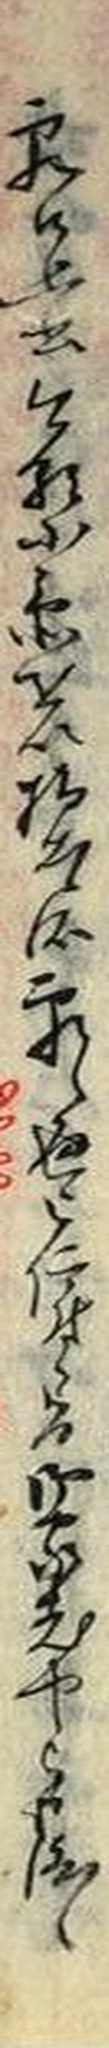願候上書今朝小兵衛を以指出候所願之通被仰付候旨御家老中被申渡候
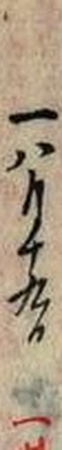一八月十九日

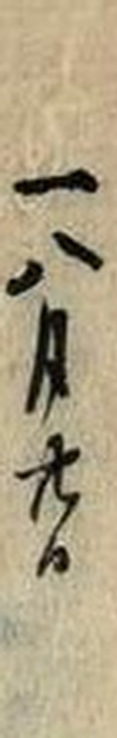一八月廿日
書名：少傅日録抄（斉承付側向頭取日記、在府）
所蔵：福井県文書館 Fukui Prefectural Archives
